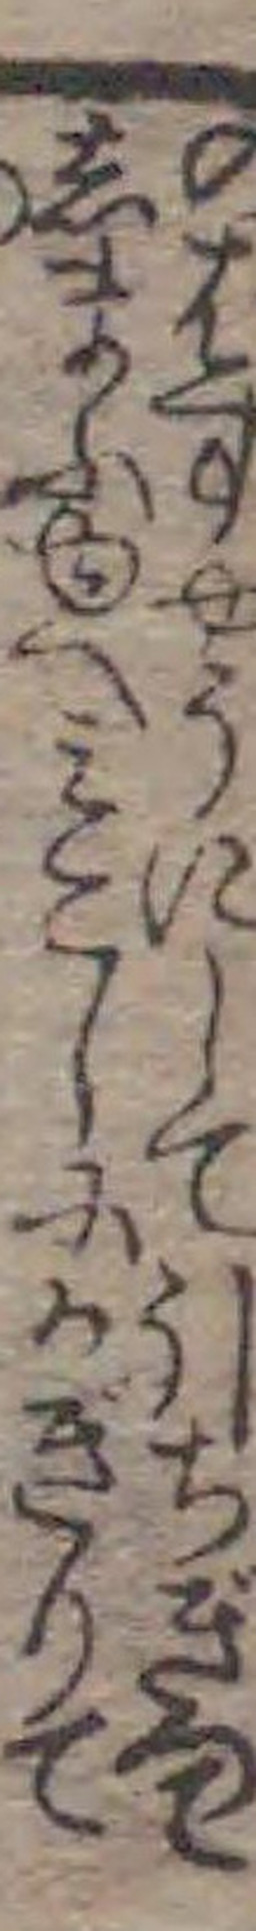しまふゆへみこしにかぎりて
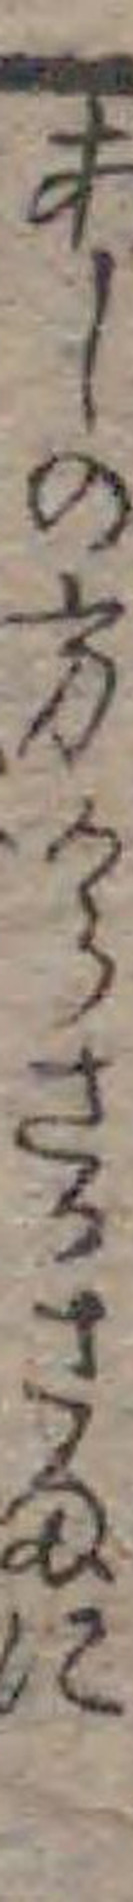あしの方からさかさまに
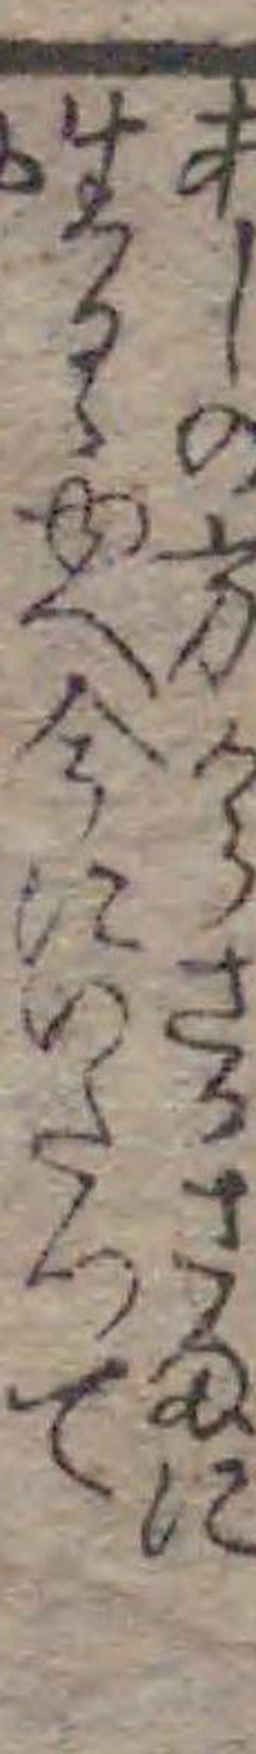生るゝゆへ今にいたつて
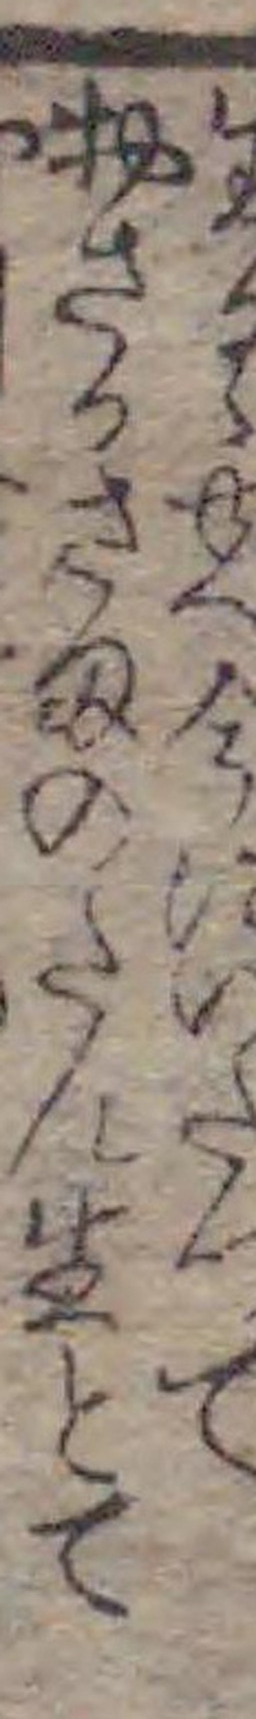おさかさまのたん生とて
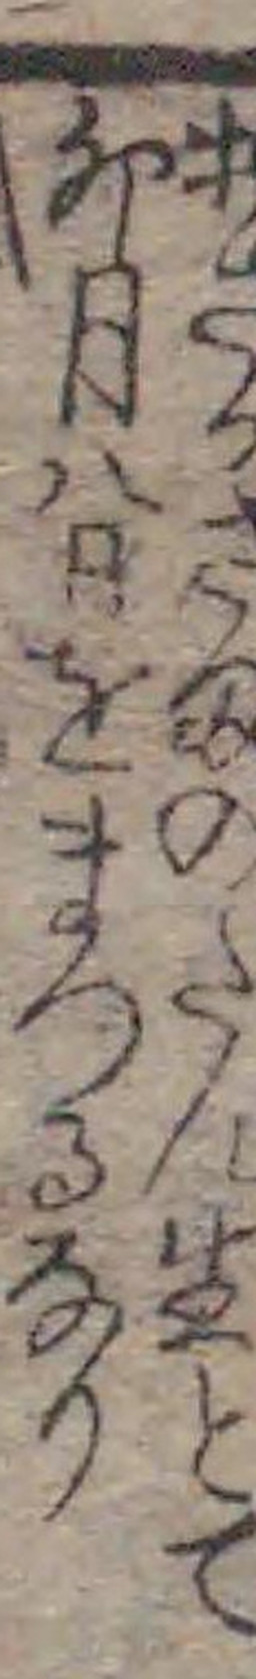卯月八日をまつるなり
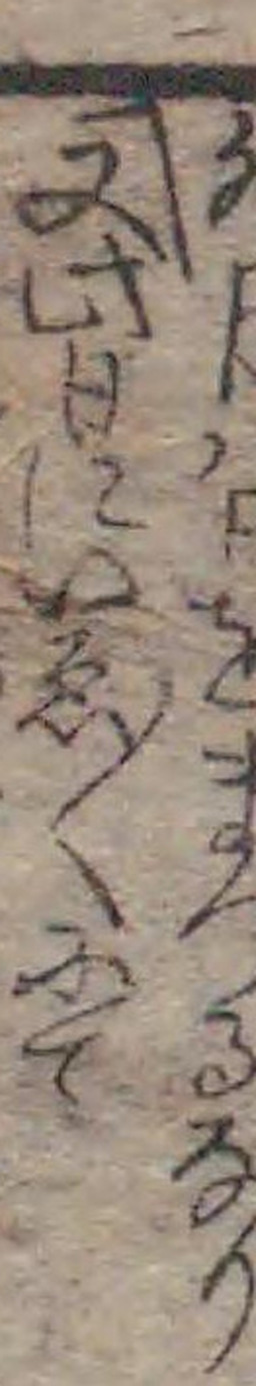〽又此日にいゑ〳〵にて
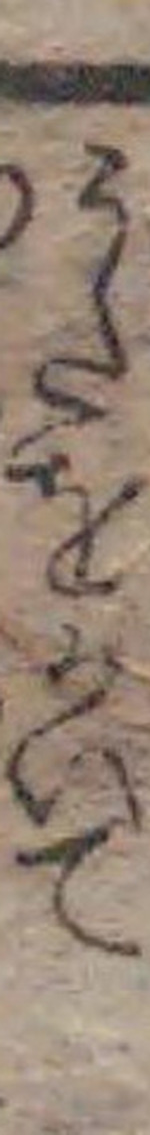うたをかいて
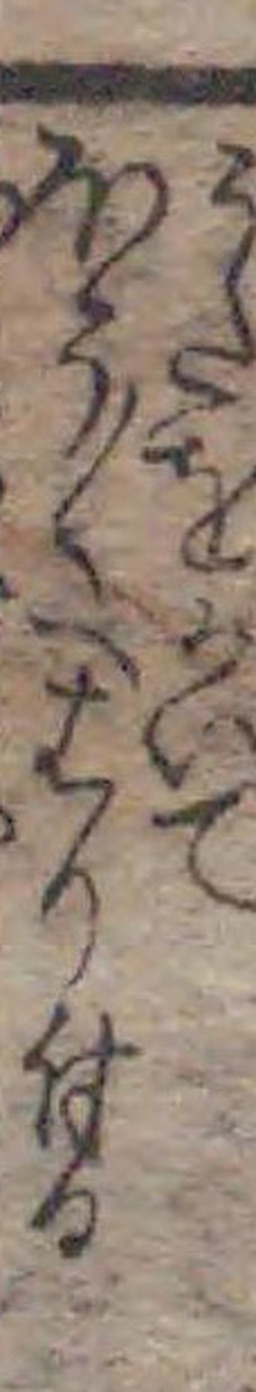ほう〳〵へはり付る
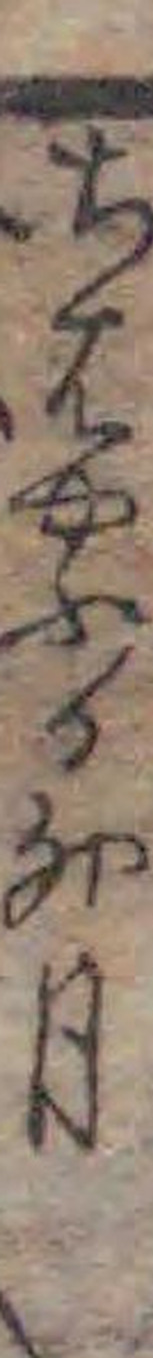ちはやふる卯月
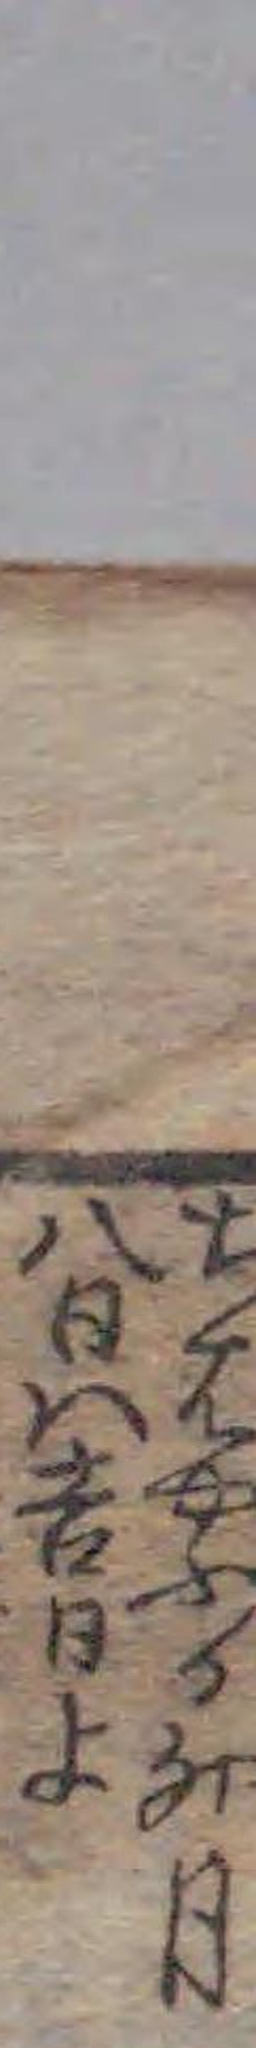八日は吉日よ
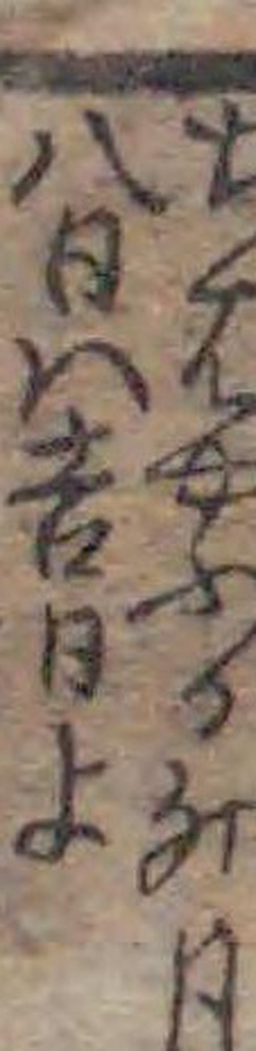八日は吉日よ
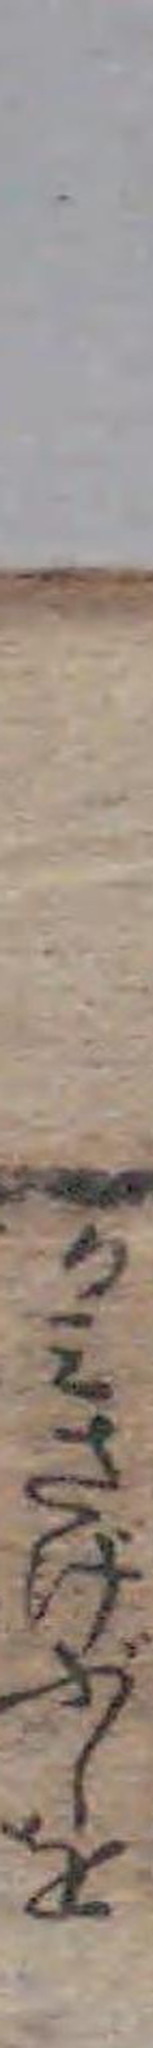かみさげぶしを
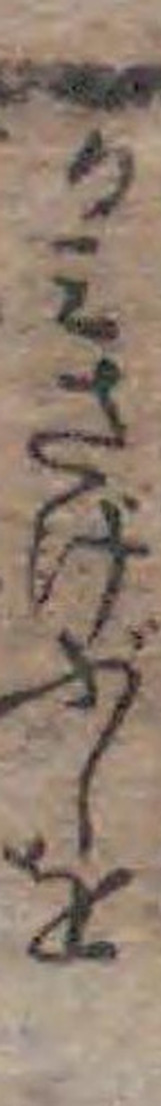かみさげぶしを
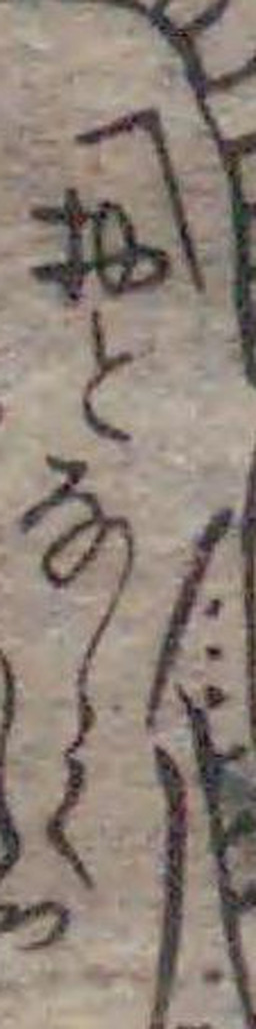〽おとなしく
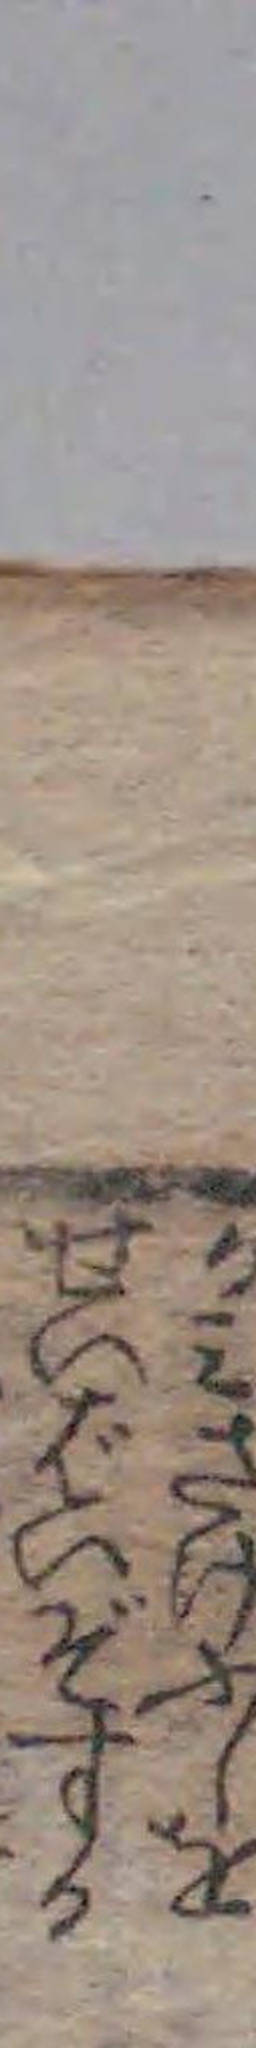せいばいぞする
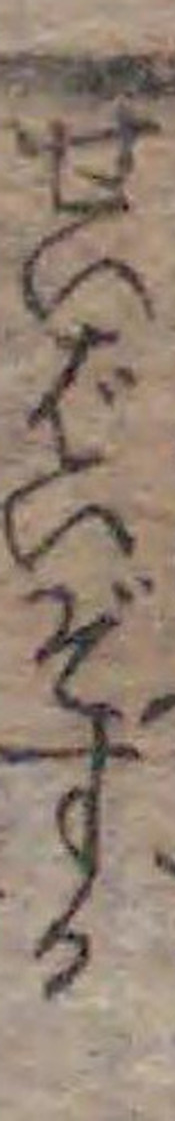せいばいぞする
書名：年中行状記 : 2巻
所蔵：国立国会図書館 National Diet Library, JAPAN
